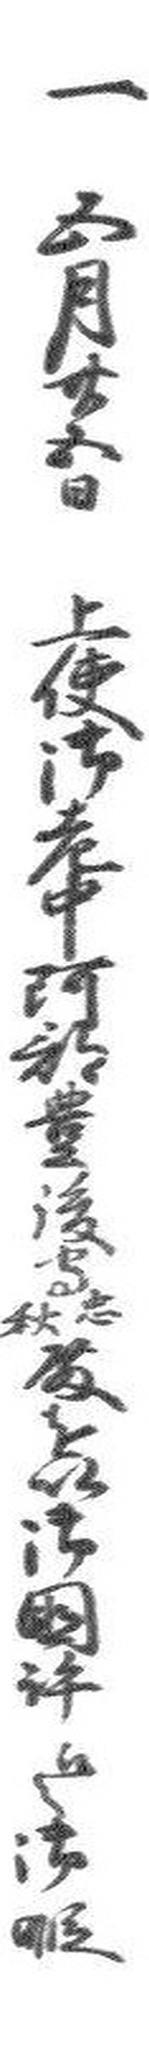一五月廿五日上使御老中阿部豊後守忠秋殿を以御国許江之御暇
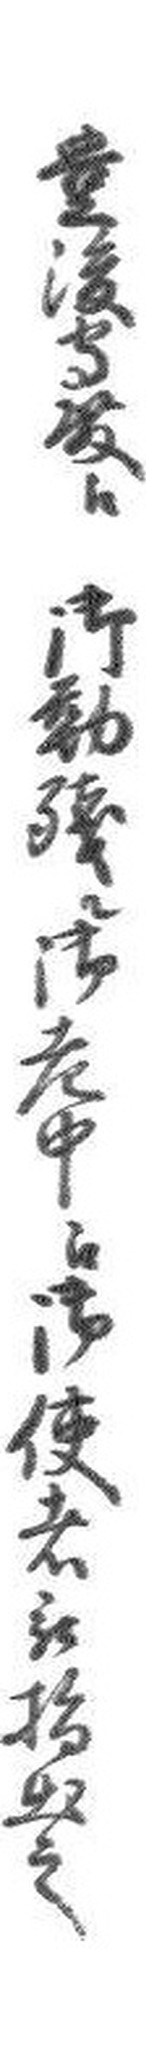豊後守殿江御勤残ル御老中江御使者被指出之
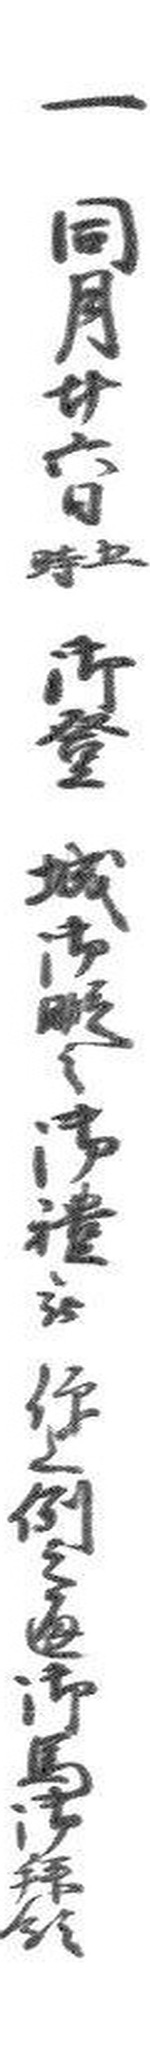一同月廿六日五時御登城御暇之御礼被仰上例之通御馬御拝領
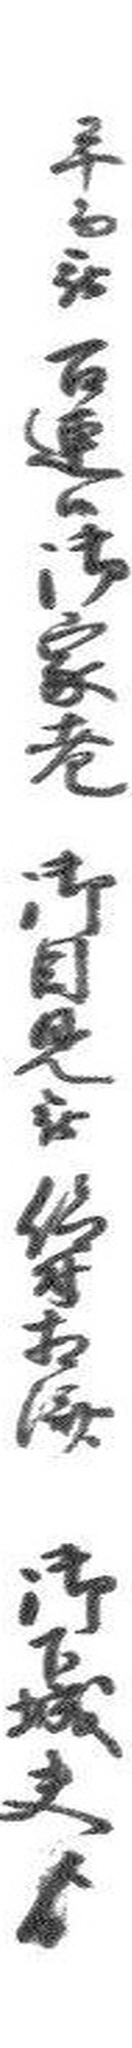畢而被召連候御家老御目見被仰付相済御下城夫ゟ
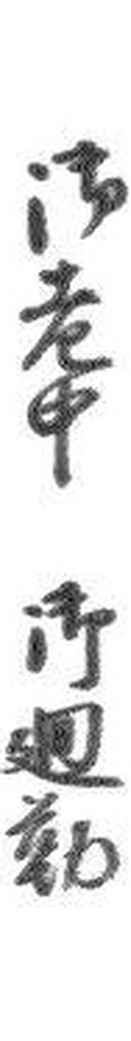御老中御廻勤

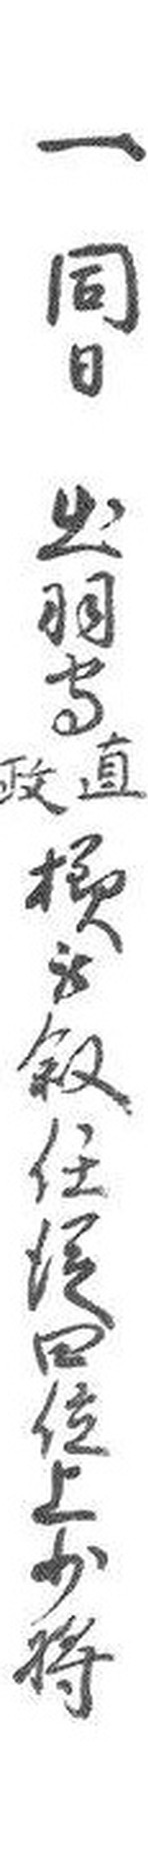一同日出羽守直政様被叙任従四位上少将
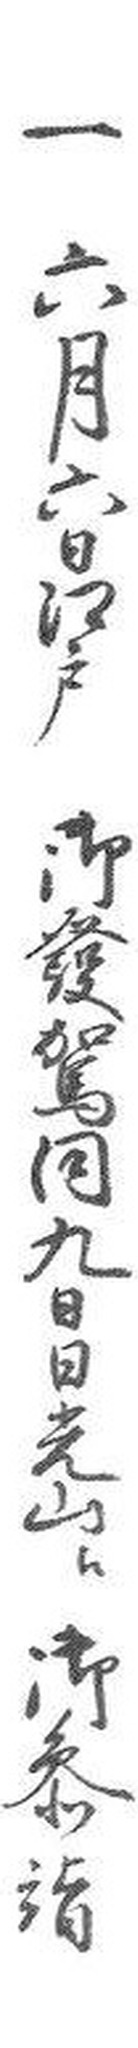一六月六日江戸御発駕同九日日光山江御参詣
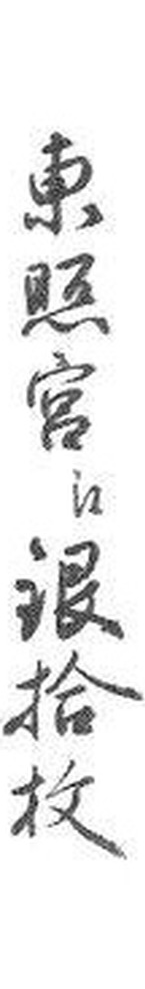東照宮江銀拾枚
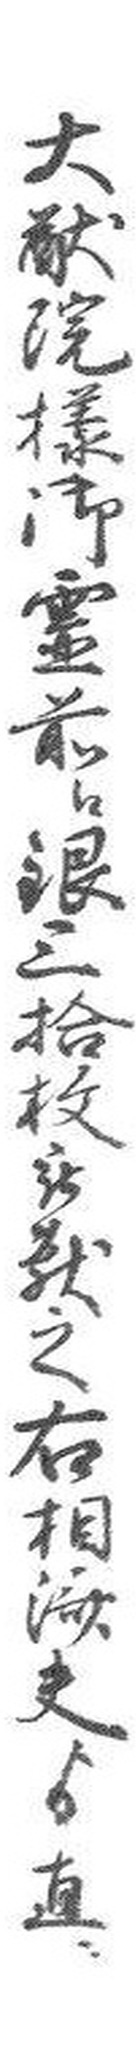大猷院様御霊前江銀三拾枚被献之右相済夫ゟ直ニ
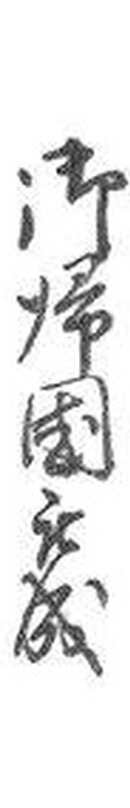御帰国被成
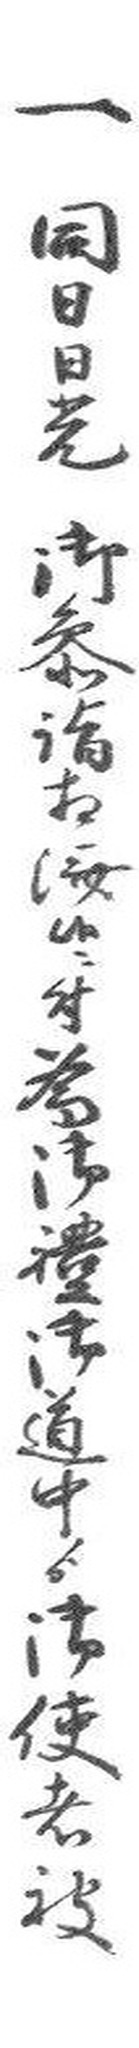一同日日光御参詣相済候ニ付為御礼御道中ゟ御使者被
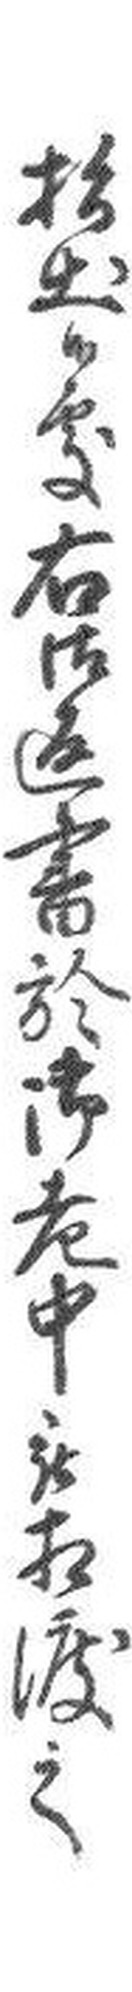指出候処右御返書於御老中被相渡之
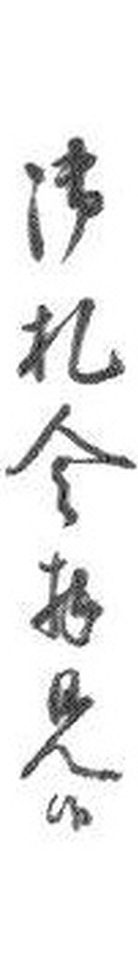御札令拝見候
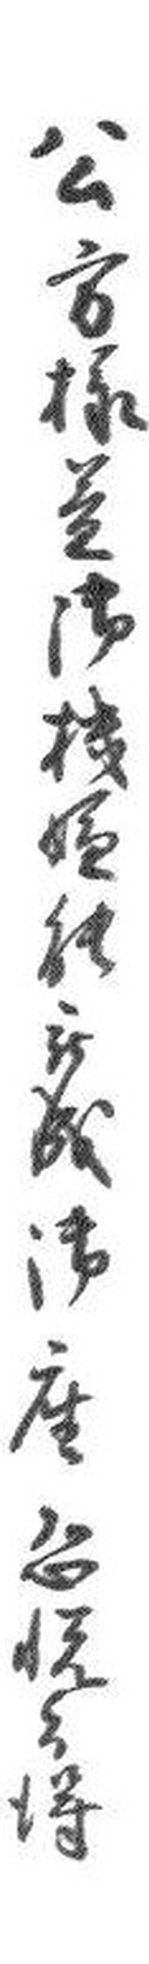公方様益御機嫌能被成御座恐悦候得
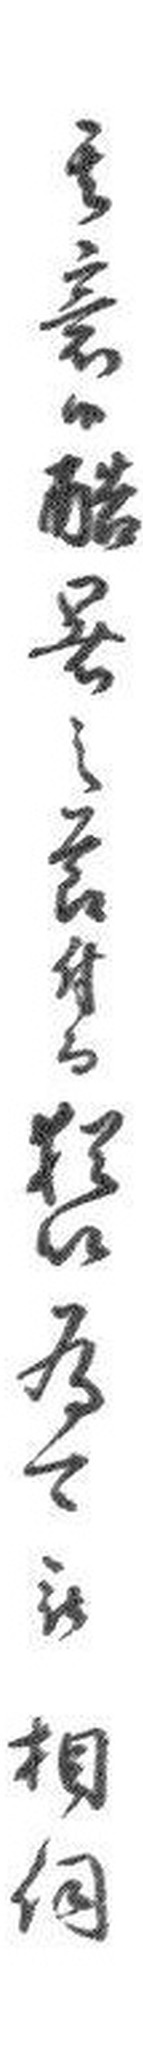其意候酷暑之節付而猶以為可被相伺
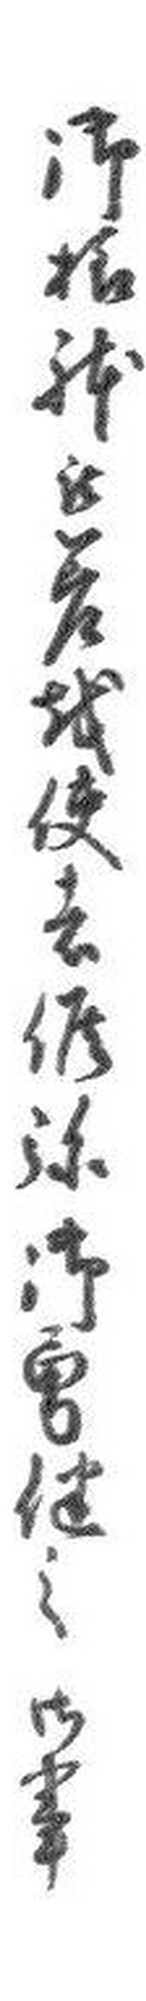御様体被差越使者候弥御勇健之御事
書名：家譜 六 光通公 従万治三年到寛文三年
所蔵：福井県文書館 Fukui Prefectural Archives
